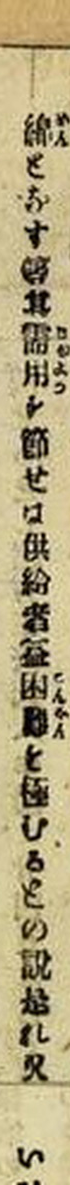綿となす等其需用を節せは供給者益困難を極むるとの説是れ又
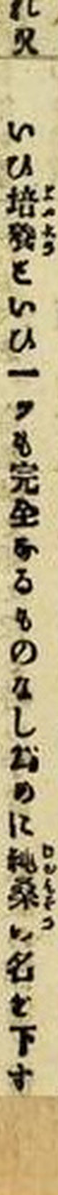いひ培養といひ一ツも完全なるものなし為めに純桑の名を下す
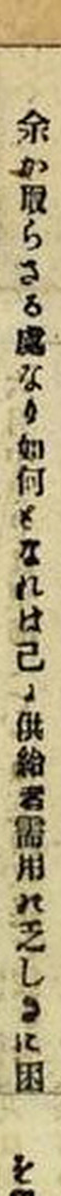余か取らさる処なり如何となれは已に供給者需用の乏しきに困
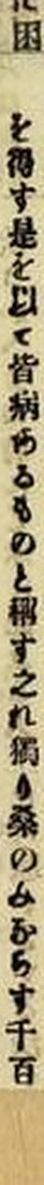を得す是を以て皆病あるものと称す之れ独り桑のみならす千百
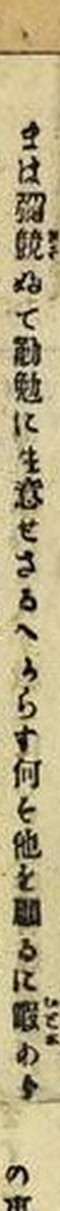まは弥競ふて勤勉に注意せさるへからす何そ他を顧るに暇あら
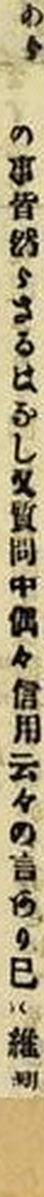の事皆然らさるはなし又質問中偶々信用云々の言あり已に維新
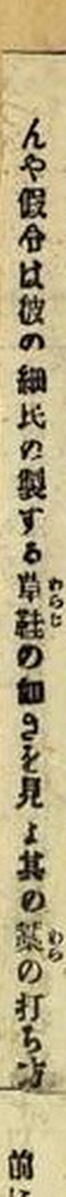んや假令は彼の細民の製する草鞋の如きを見よ其の稾の打ち方
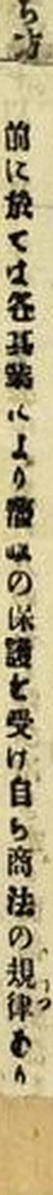前に於ては各其業により藩の保護を受け自ら商法の規律あり
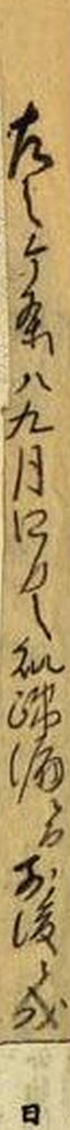左之ケ条ハ九月四日之処疎漏ニ而前後ニ成
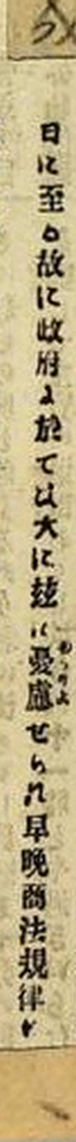日に至る故に政府に於ては大に茲に憂慮せられ早晩商法規律を
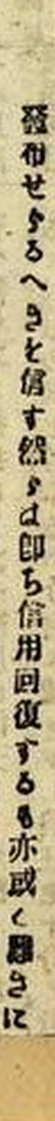発布せらるへきを信す然らは即ち信用回復するも亦或は難きに
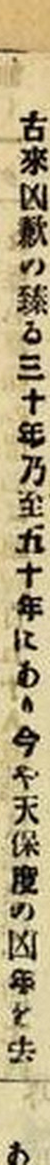古来凶歉の臻る三十年乃至五十年にあり今や天保度の凶年を去
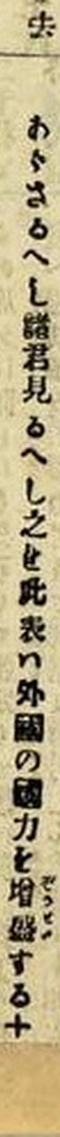あらさるへし諸君みるへし之れ此表は外国の国力を増盛する十
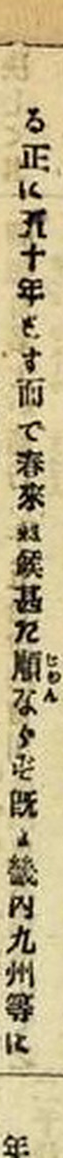る正に五十年とす而て春来気候甚た順ならず既に畿内九州等に
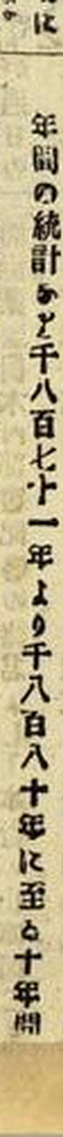年間の統計なり千八百七十一年より千八百八十年に至る十年間
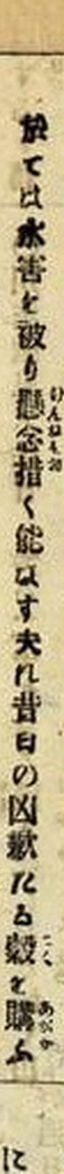於ては水害を被り懸念措く能はす夫れ昔日の凶歉たる穀を購ふ
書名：温古集 五巻
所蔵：福井県文書館 Fukui Prefectural Archives
